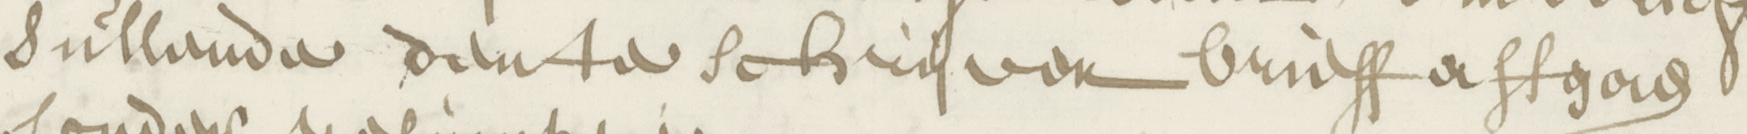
sullende den te schrijven brieff affgaen
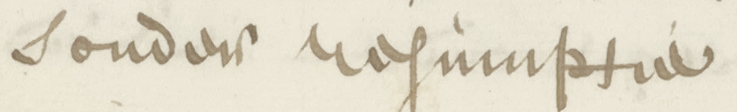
sonder resumptie
